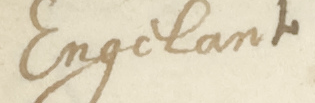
Engelant
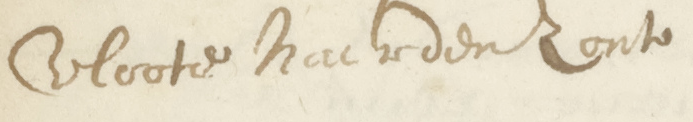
Vloote naer den Zonte
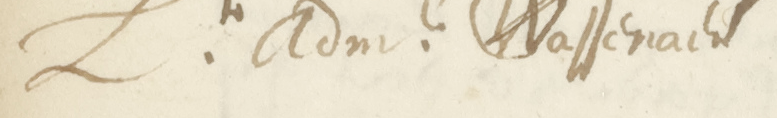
Lt. Adml. Wassenaer
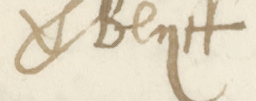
vblyff
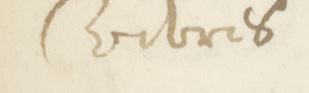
Vivres
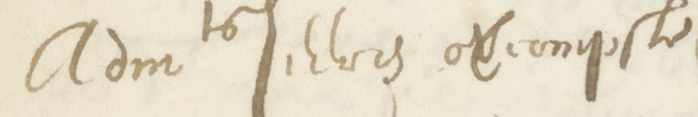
Admtsheeren ovcompste
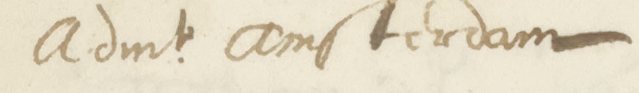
Admt. Amsterdam
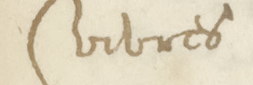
Vivres
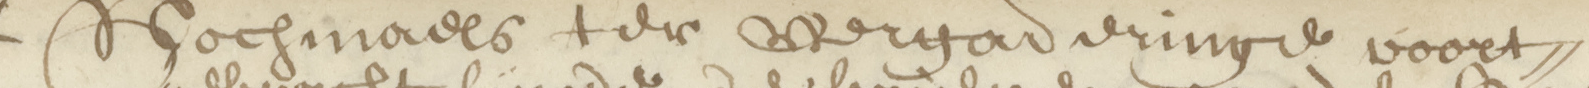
Nochmaels ter Vergaderinge voort„
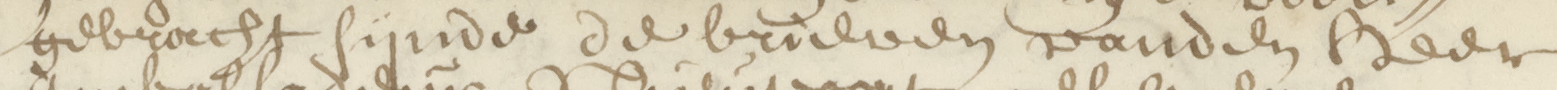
gebracht sijnde de brieven vanden Heer
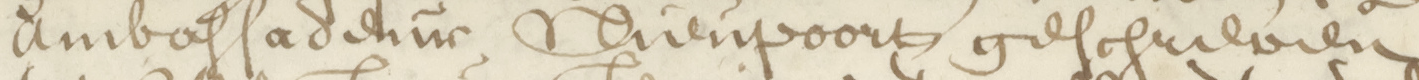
Ambassadeur Nieupoort, geschreven
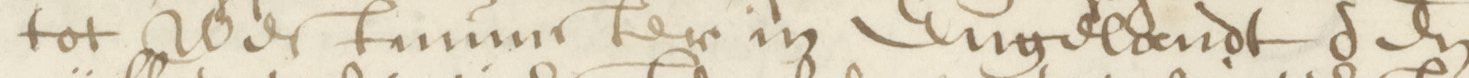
tot Westmunster in Engelandt den
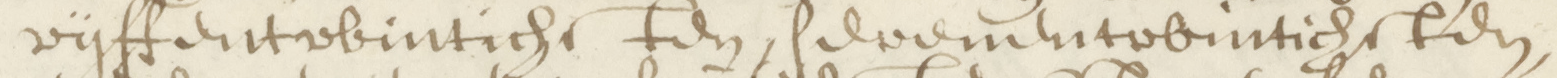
vijffentwintichsten, sevenentwintichsten,
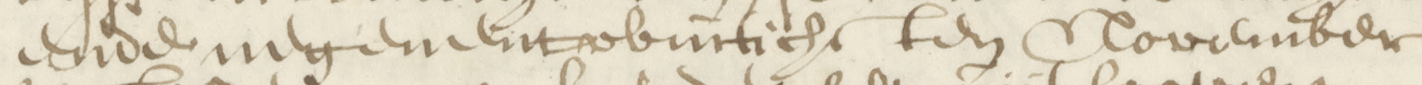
ende negenentwintichsten November
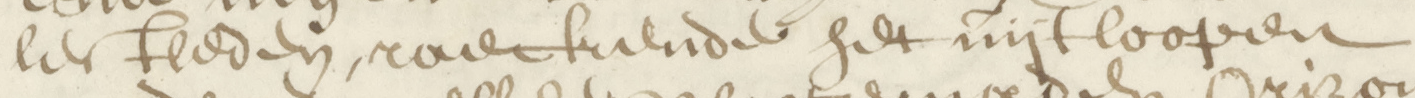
lestleden, raeckende het uijtloopen
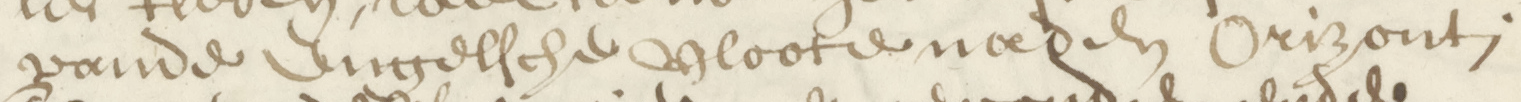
vande Engelsche Vloote naden Orizont;
